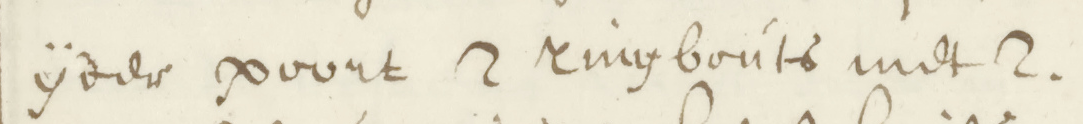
ijder poort 2 ringbouts met 2.
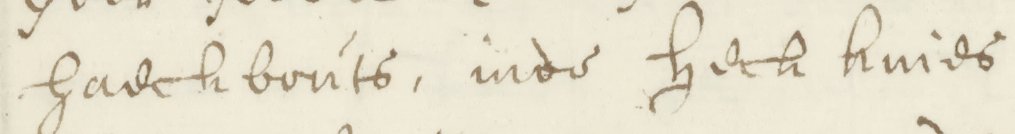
haeckbouts, inde Heck knies
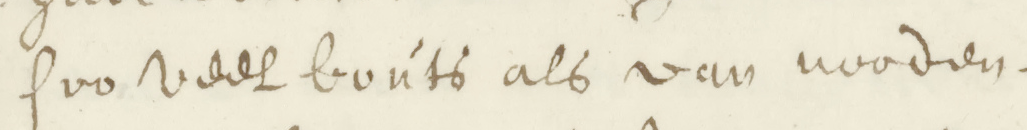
soo veel bouts als van nooden
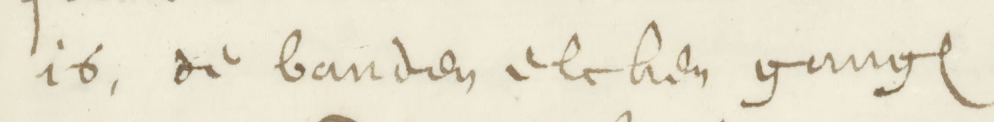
is, de banden elcken gangh
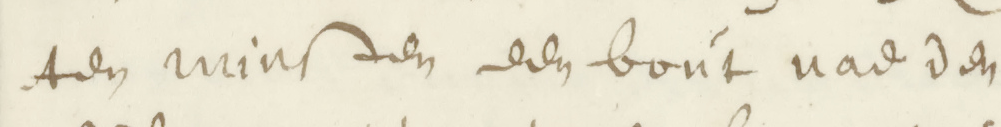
ten minsten een bout nae den
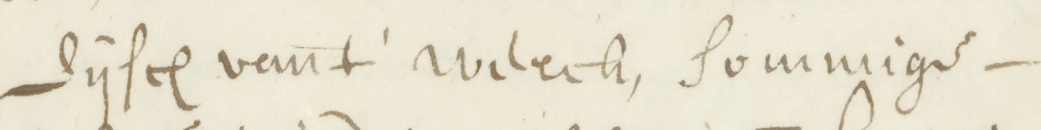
Eijsch van t' werck, sommige -
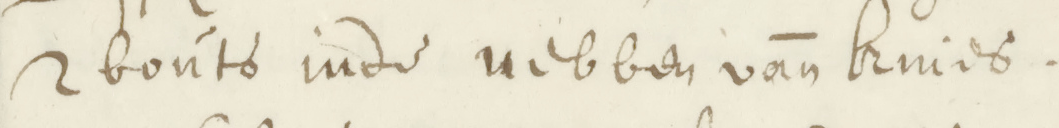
2 bouts inde nebben van knies
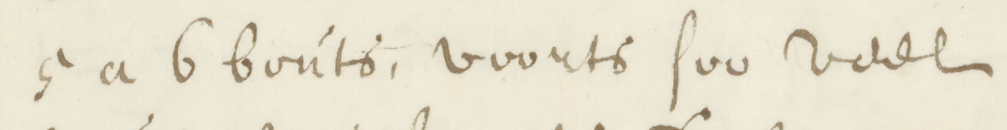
5 a 6 bouts, voorts soo veel
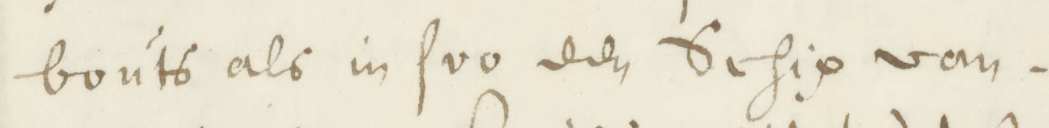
bouts als in soo een schip van
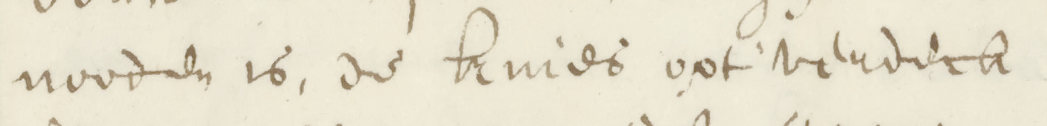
nooden is, de knies opt' verdeck
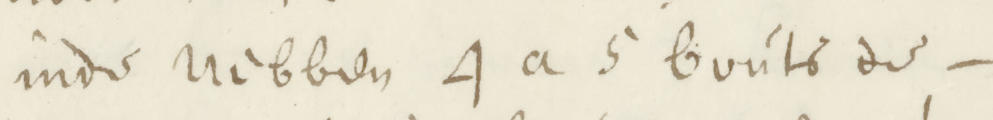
inde nebben 4 a 5 bouts de
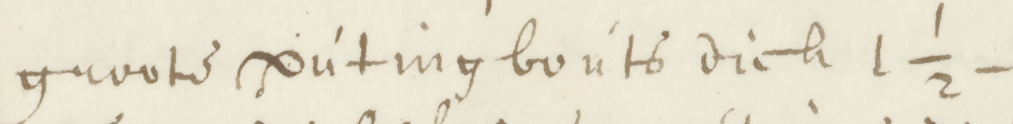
groote putingbouts dick 1½
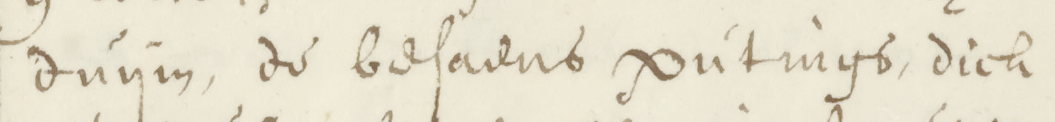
duijm, de besaens putings, dick
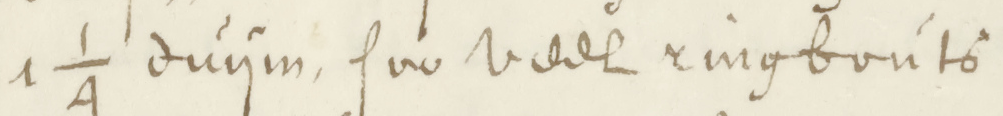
1¼ duijm, soo veel ringbouts
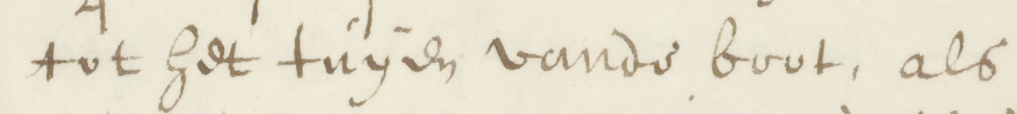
tot het tuijen vande boot, als
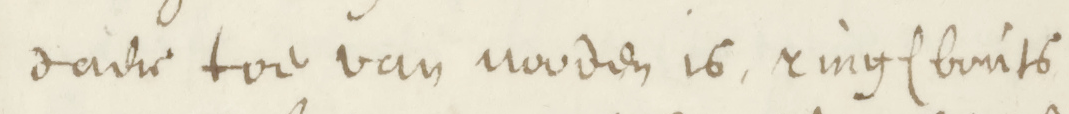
daer toe van nooden is, ringhbouts
